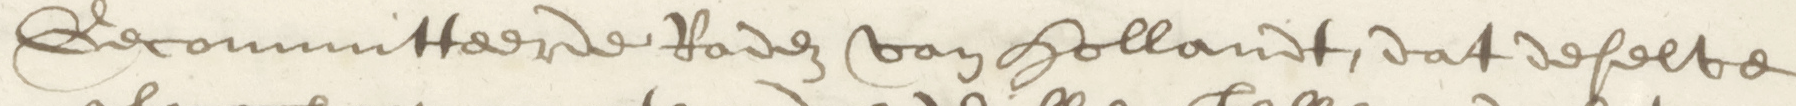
Gecommitteerde Raden van Hollandt dat deselve
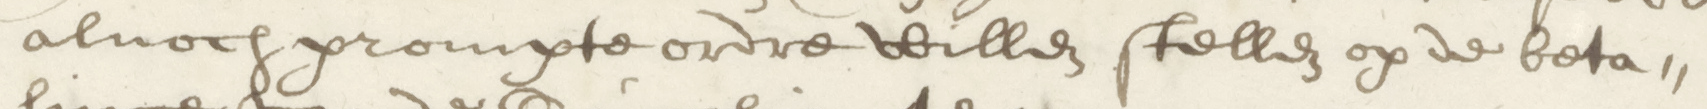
alnoch prompte ordre willen stellen op de beta„
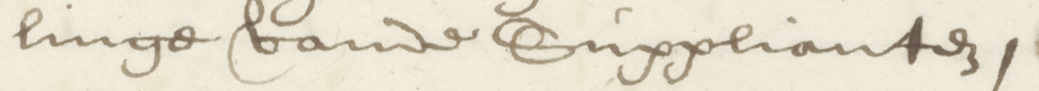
linge vande Supplianten.
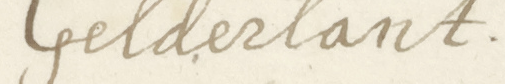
Gelderlant
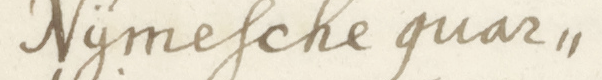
Nijmesche quar„
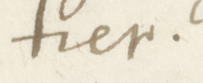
tier
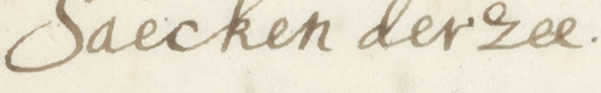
Saecken der zee
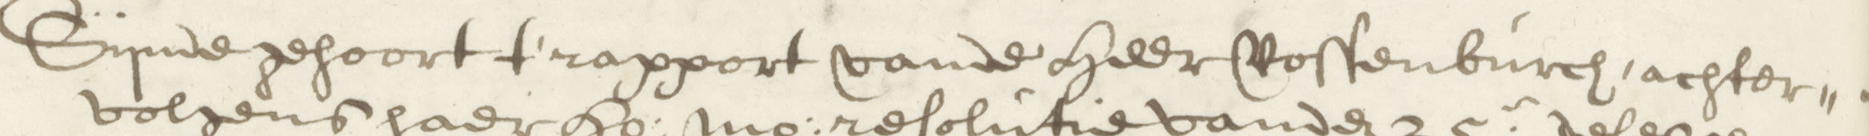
Sijnde gehoort t'rapport vande heer Rossenburch, achter„
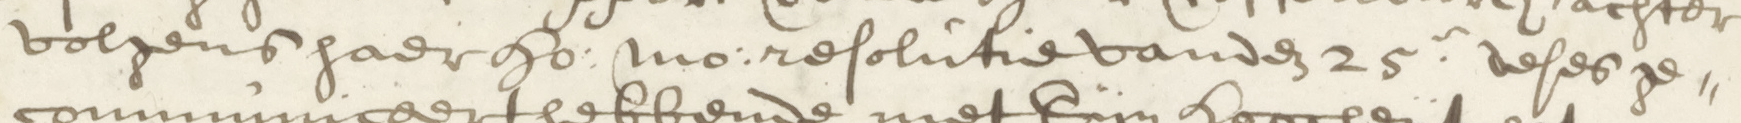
volgens haer Ho:mo: resolutie vanden 25e deses ge„
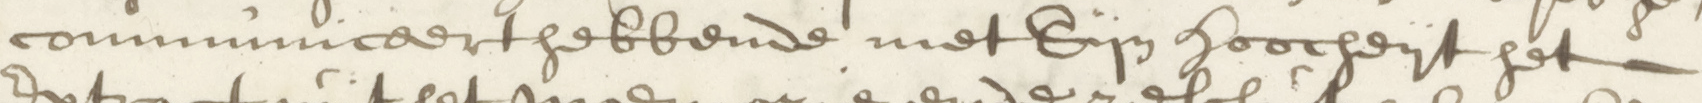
communiceert hebbende met Sijn Hoocheijt het -
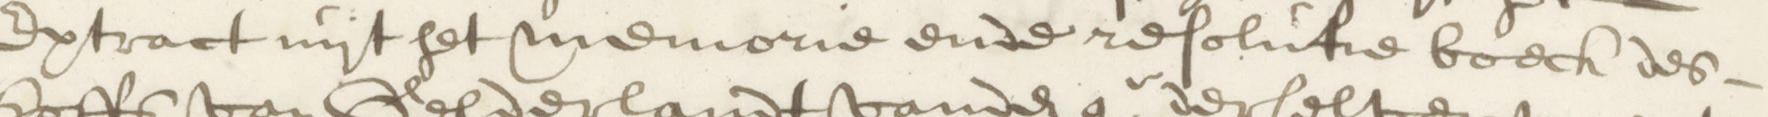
Extract uijt het memorie ende resolutie boeck des
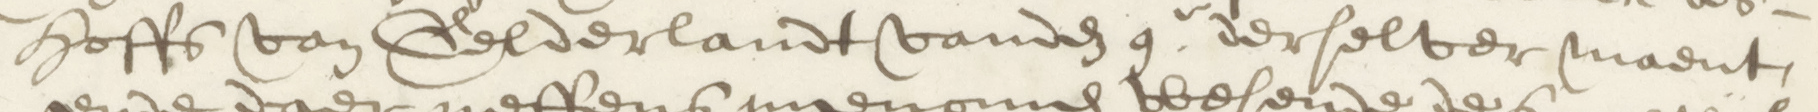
Hoffs van Geldderlandt vanden 9e derselver maent
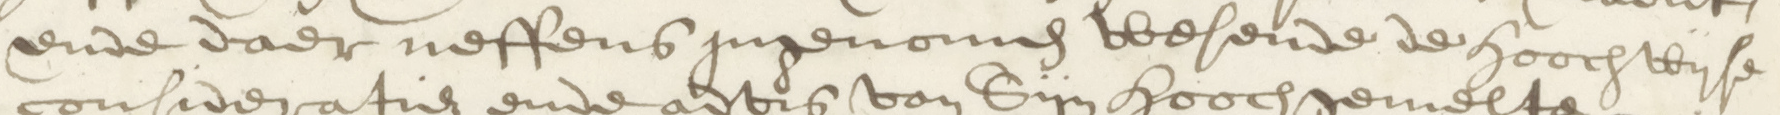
ende daer neffens ingenomen wesende de hoochwijse
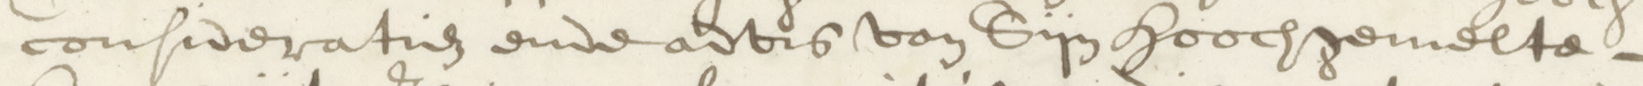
consideratien ende advis van Sijn Hoochgemelte
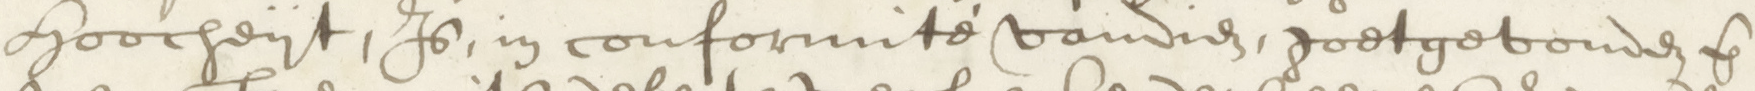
Hoocheijt, Is, in conformité vandien, goetgevonden &
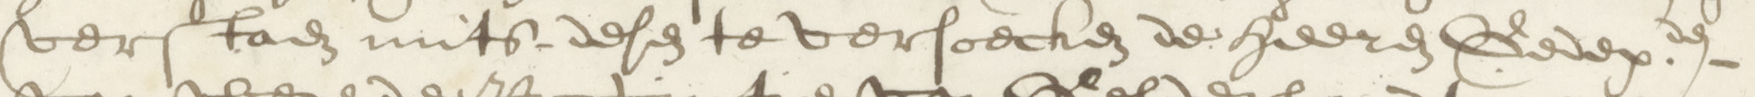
verstaen mits desen te versoecken de heeren Gedepden
